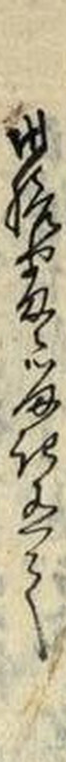御膳番ニ留記有之
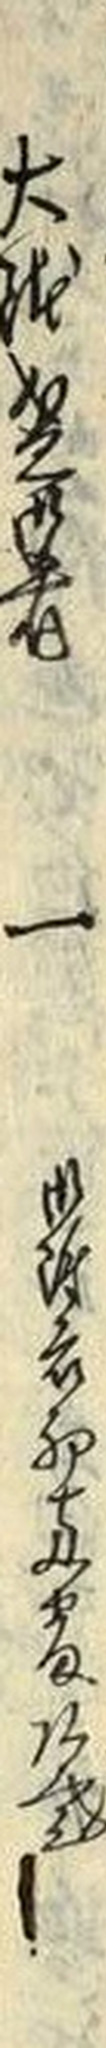大鉢盛御肴一御附衆初両番頂戴
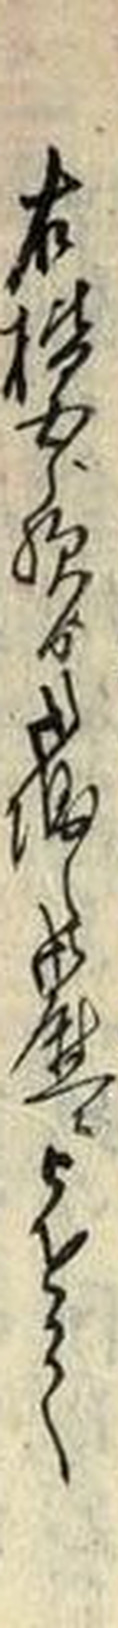右楷五郎様ゟ御側御慰ニ被進之
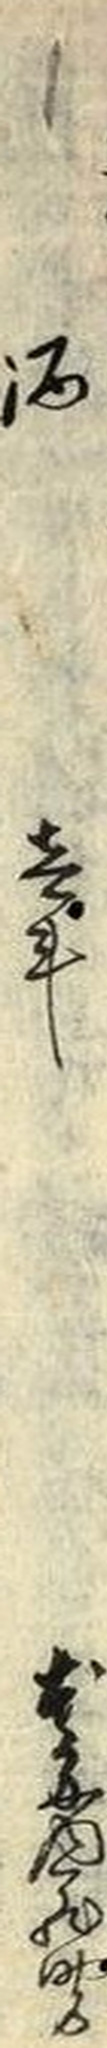酒壱斗本多内蔵助方
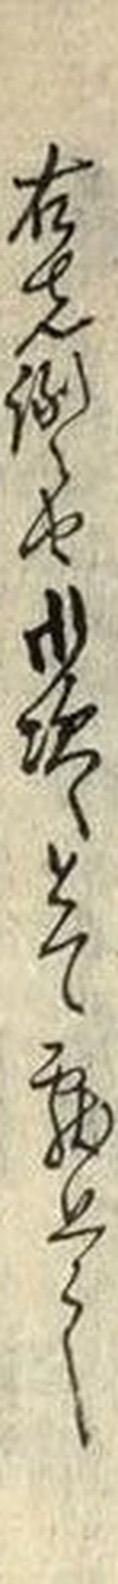右先例之由御次へとて献上之
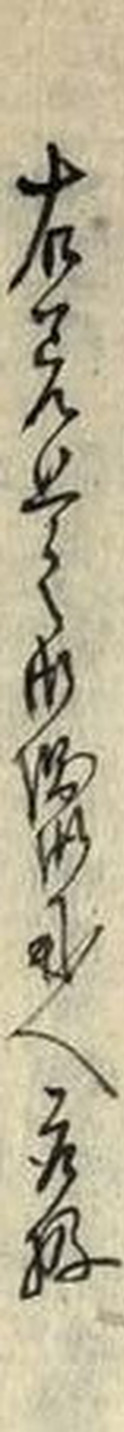右差上之御側御用人取扱
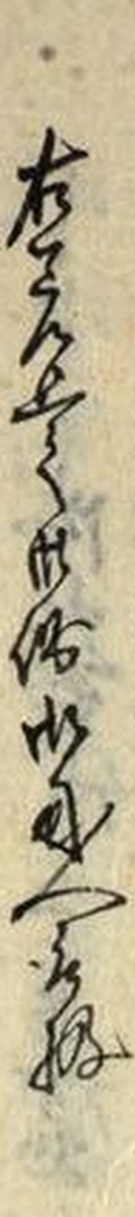右差上之御側御用人取扱

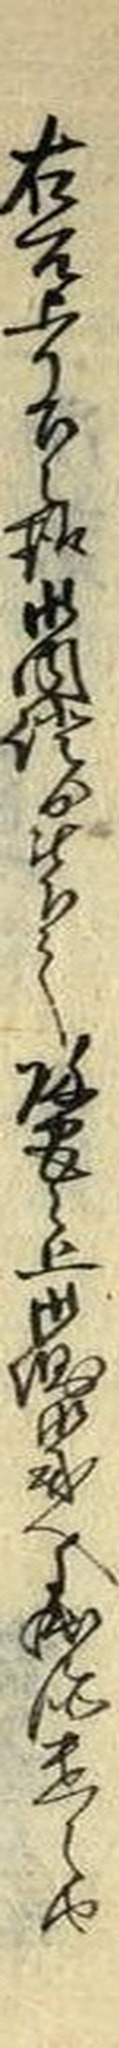右召上り下之趣御内証ゟ被下之帰宅之上御側御用人手紙添遣之由
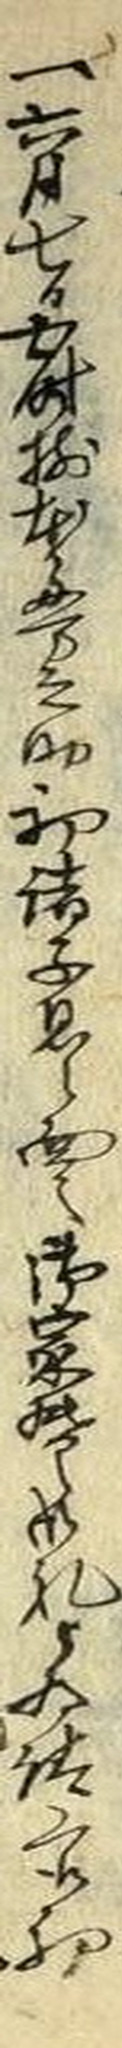一六月七日五時揃本多万之助初諸子息之面々御家督之御礼被為請最初
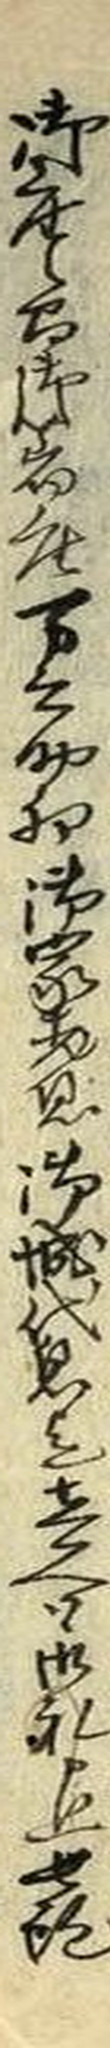御座之間御着座万之助初御家老息御城代息迄壱人ツヽ御礼申上長鮑
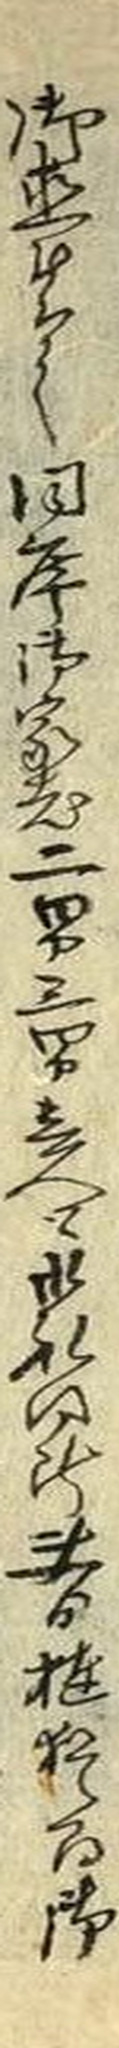御直被下之同席御家老二男三男壱人ツヽ御礼同断夫ゟ韃靼之間御
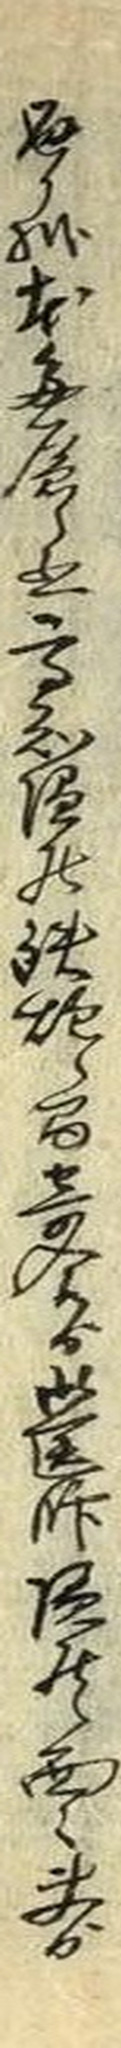通り掛本多廉之丞高知隠居鉄炮之間寄合ゟ御医師隠居之面々夫ゟ
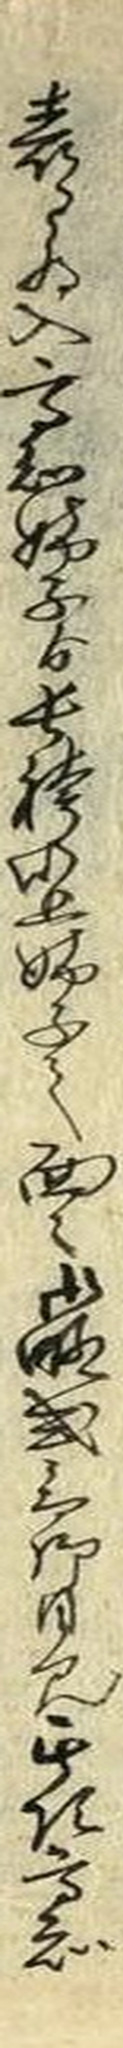表へ被為入高知嫡子ゟ長袴以上嫡子之面々御略式ニ而御目見其次高知
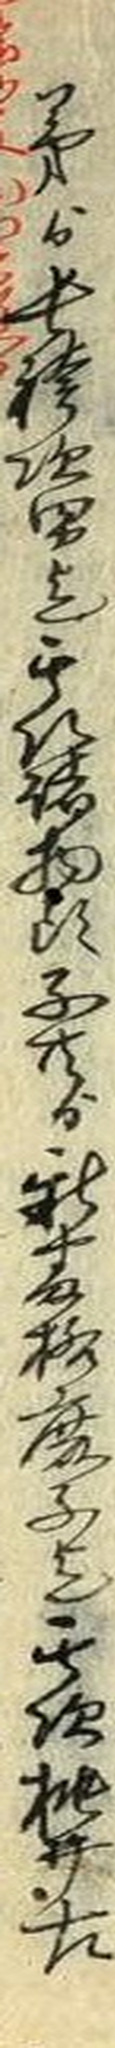弟ゟ長袴次男迄其次諸物頭子共ゟ新番格庶子迄其次桃井左
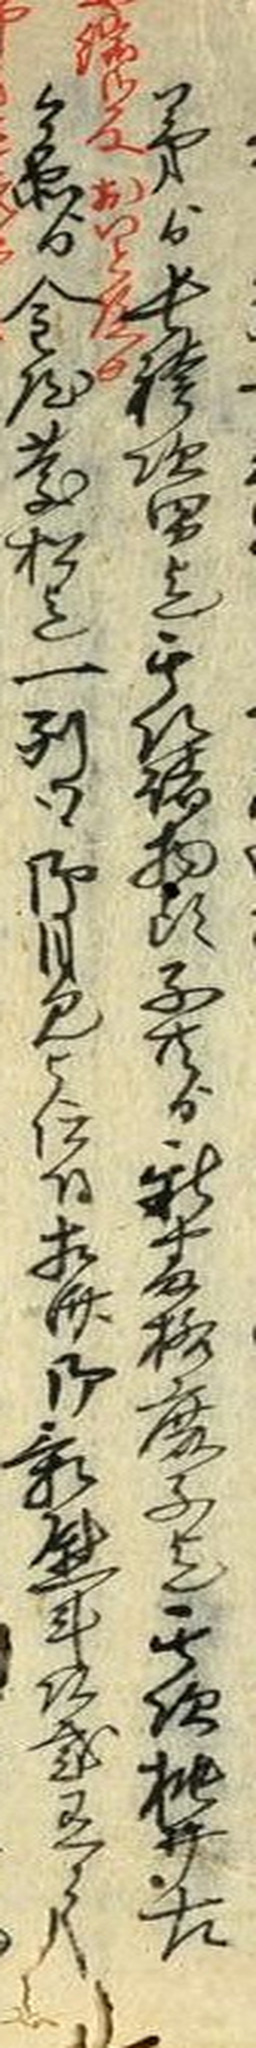兵衛ゟ金屋慶松迄一列ツヽ御目見被仰付相済御影熨斗頂戴有之
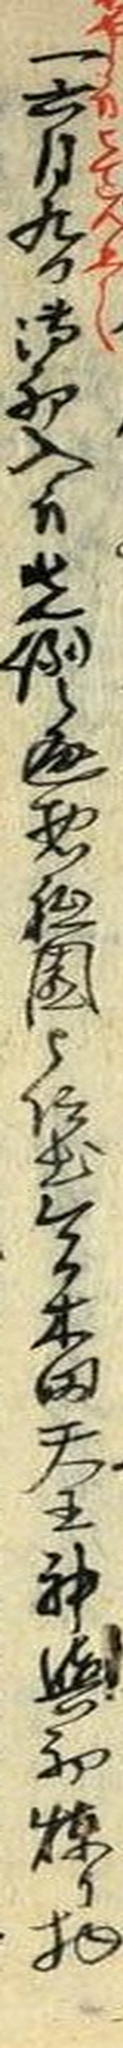一六月九日御初入ニ付先例之通惣祇園被仰出今日木田天王神輿初練り物
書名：少傅日録抄（斉善付側向頭取日記、江戸并道中、初入在国、逝去後…
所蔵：福井県文書館 Fukui Prefectural Archives
